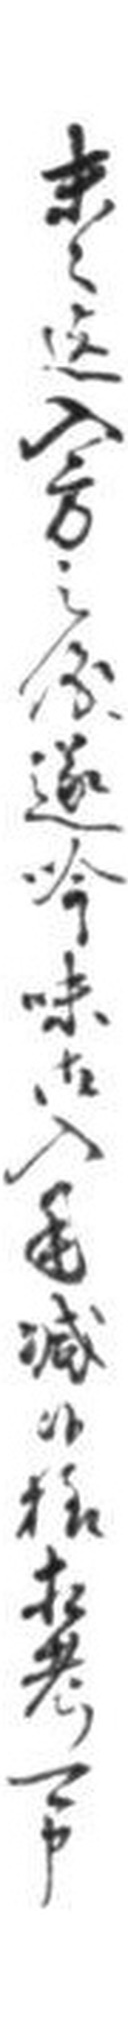末々迄入方之儀遂吟味御入用減候様相考可申
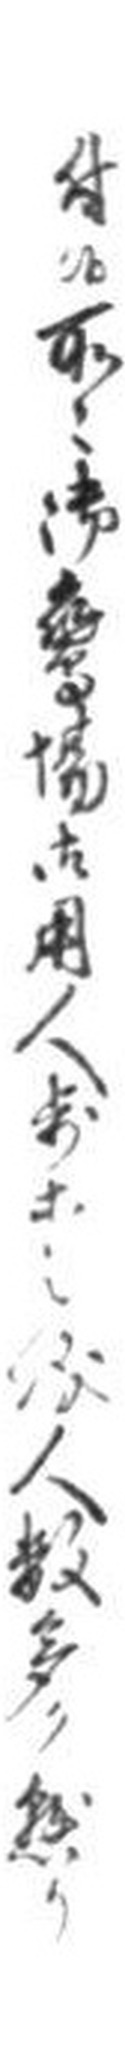付候所々御鷹場御用人歩等之儀人数多ク懸り
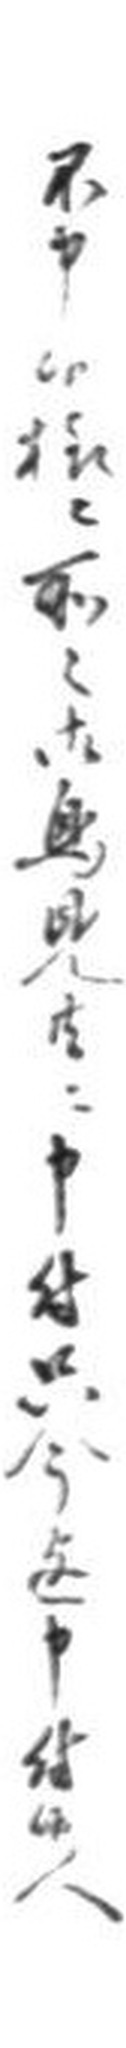不申候様ニ所々御鳥見共ニ申付只今迄申付候人
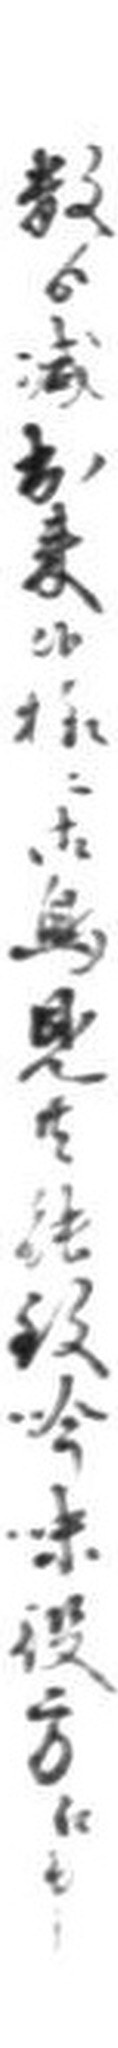数ゟ減出来候様ニ御鳥見共能致吟味役方江も申
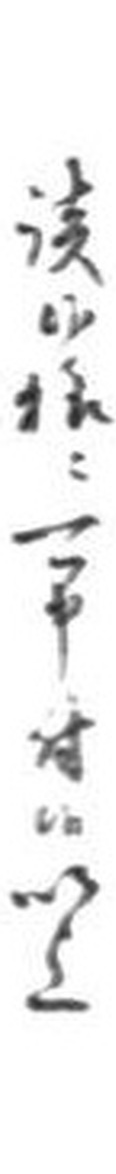談候様ニ可申付候以上
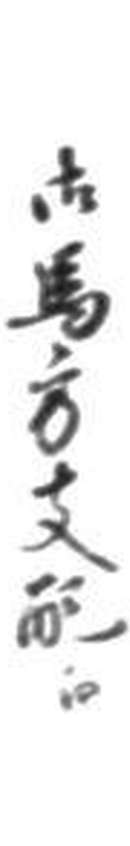御馬方支配江
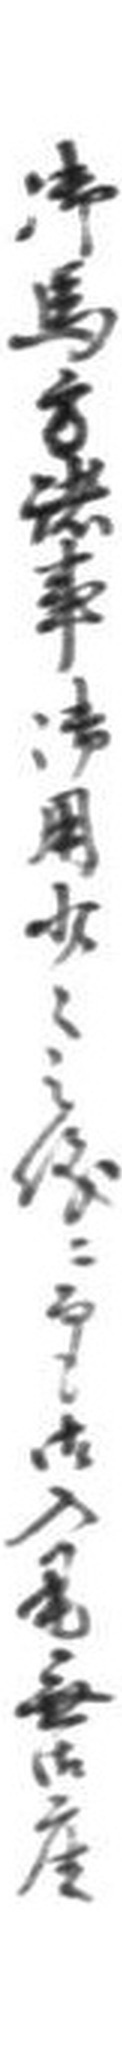御馬方諸事御用少々之儀ニ而も御入用無御座
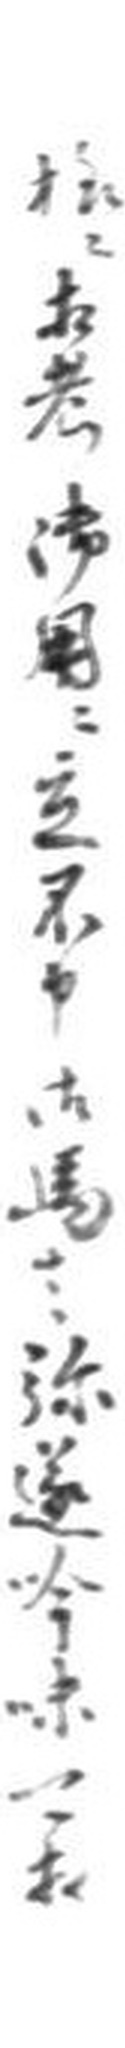様ニ相考御用ニ立不申御馬者弥遂吟味可相
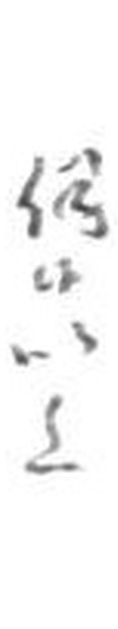伺候以上

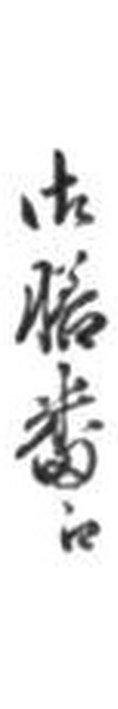御膳番江
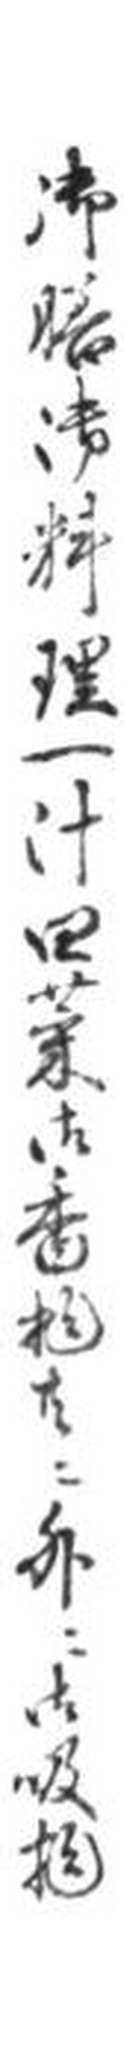御膳御料理一汁四菜御香物共ニ外ニ御吸物
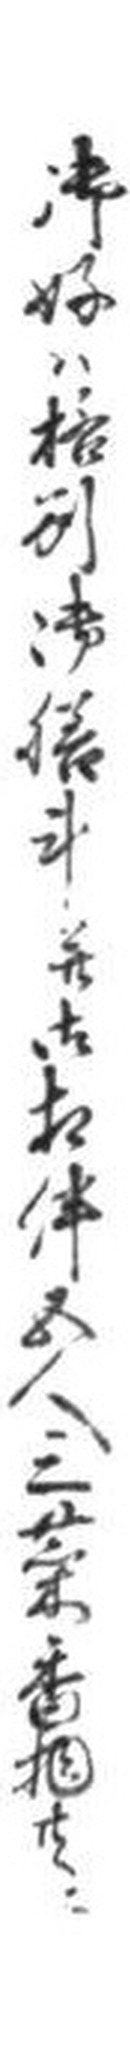御好ハ格別御膳斗并御相伴五人三菜香物共ニ
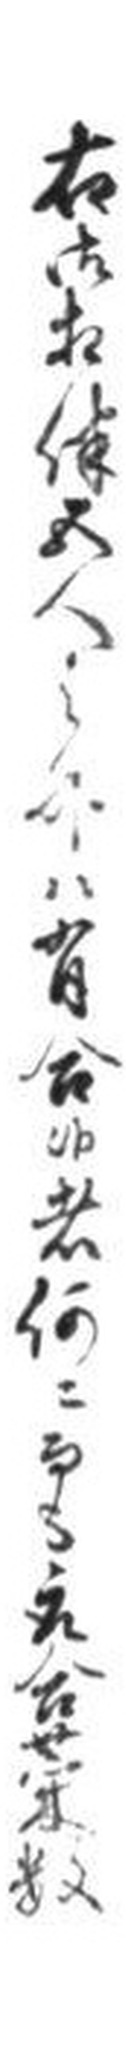右御相伴五人之外ハ有合候者何ニ而も取合菜数
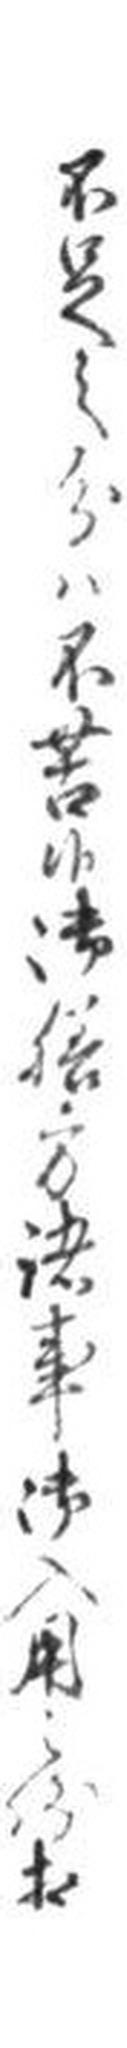不足之分ハ不苦候御膳方諸事御入用之儀相
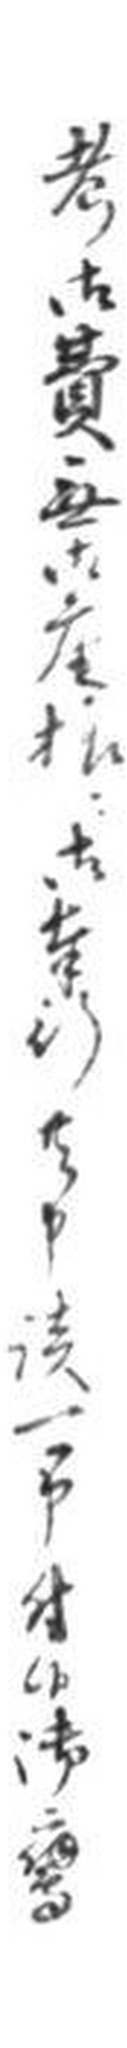考御費無御座様ニ御奉行共申談可申付候御鷹
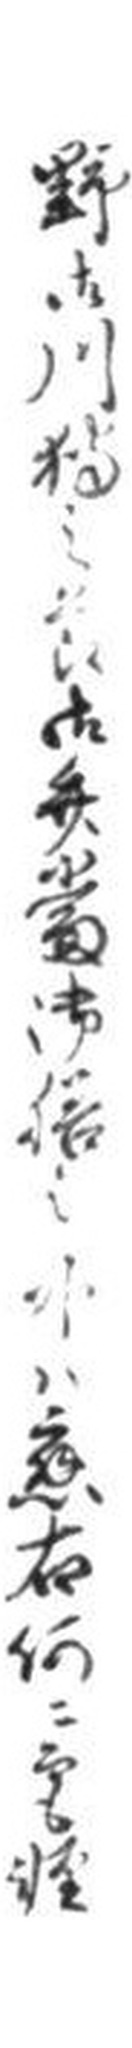野御川狩之節御弁当御膳之外ハ応右何ニ而も軽
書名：家譜 二十二 吉品公 従元禄十五年到同十六年
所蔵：福井県文書館 Fukui Prefectural Archives
